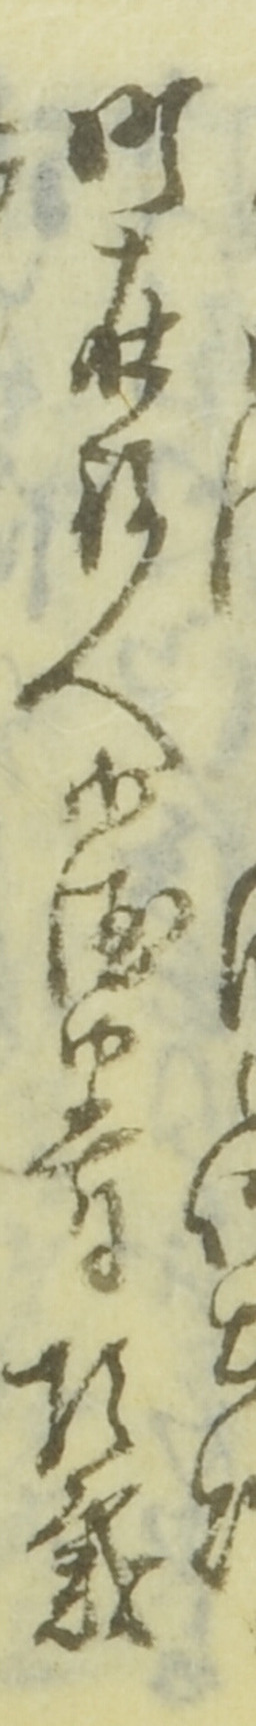町在役人御酒御肴頂戴
